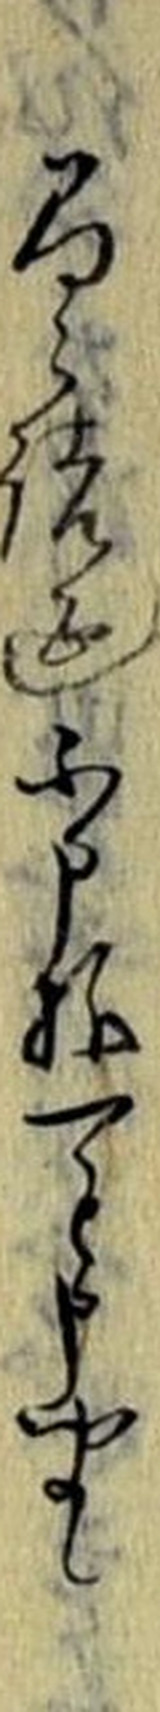間々詰延不申様可被申聞候
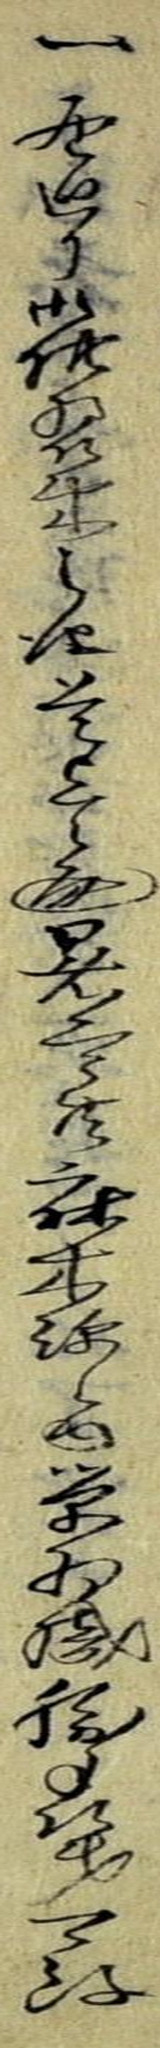一野廻り御供装束之儀是迄之通暑寒共麻木綿之内単羽織勝手次第可致
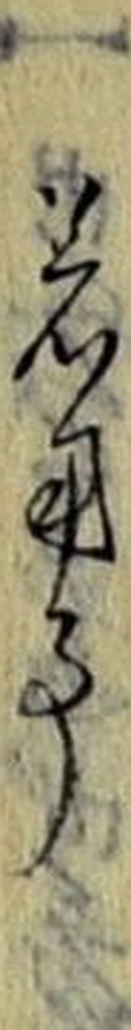着用事
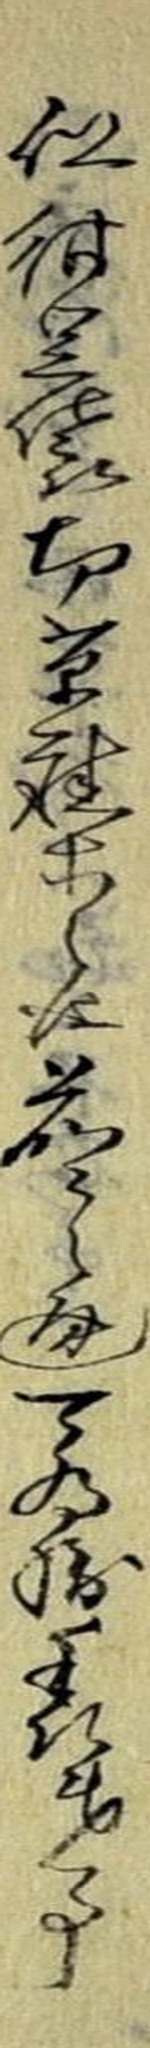但紺足袋切草鞋等之儀前々之通可為勝手次第事
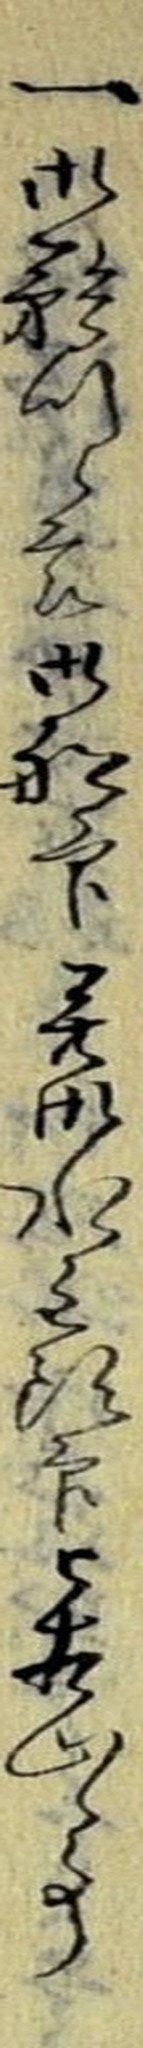一御鵜川之節御船印并御水主頭印被相止候事
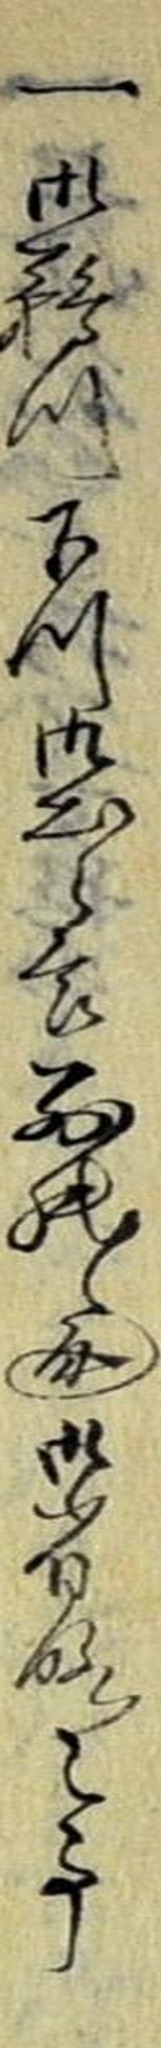一御鵜川下川御出之節別紙之通御省略之事
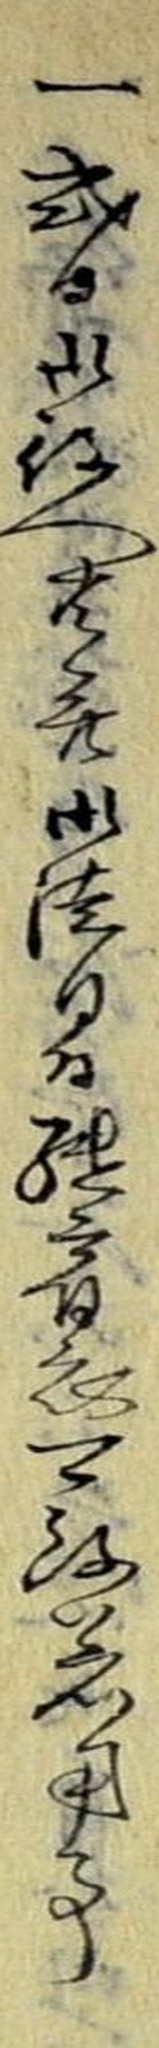一式日御役人共并御徒目付継肩衣可致着用事
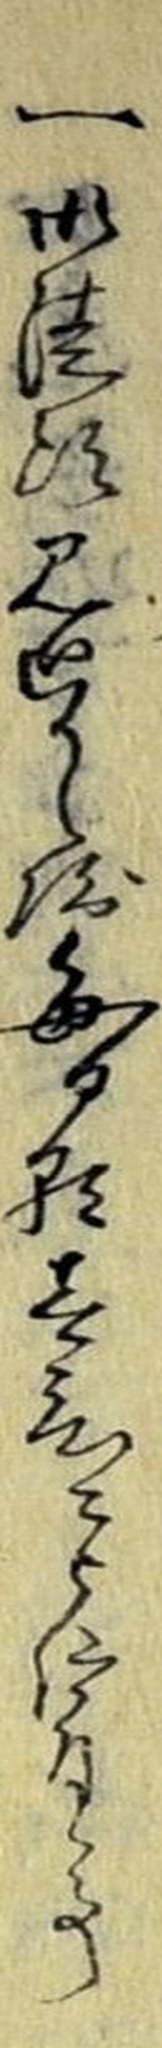一御徒頭見廻り之儀毎日朝壱度に被仰付候事
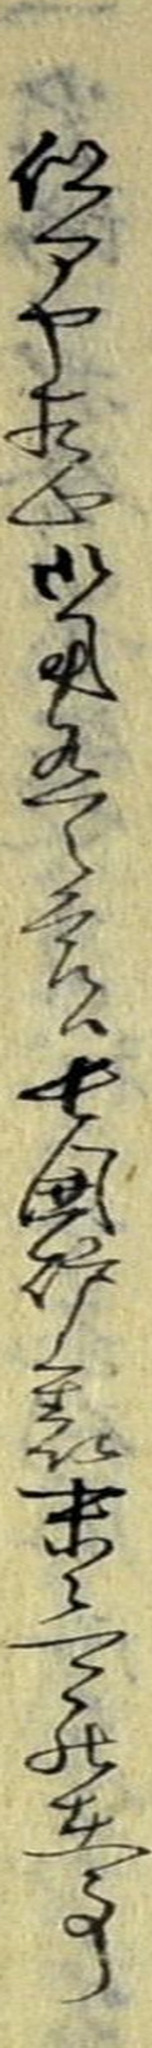但部屋相止御用有之節は長囲炉裏末に可罷在事
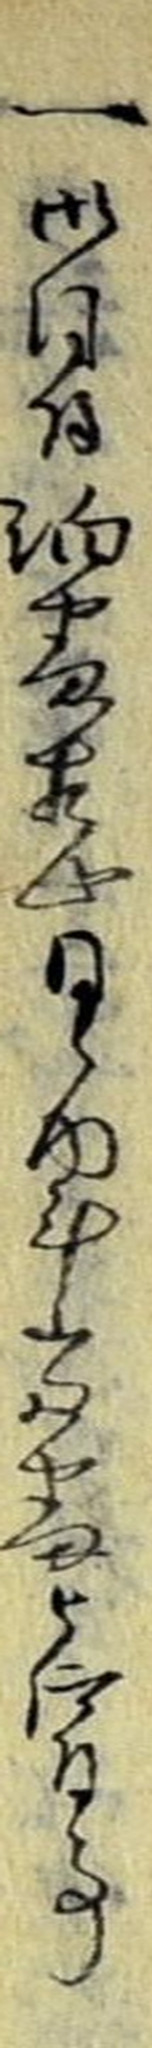一御目付泊番相止日之内斗当番被仰付候事
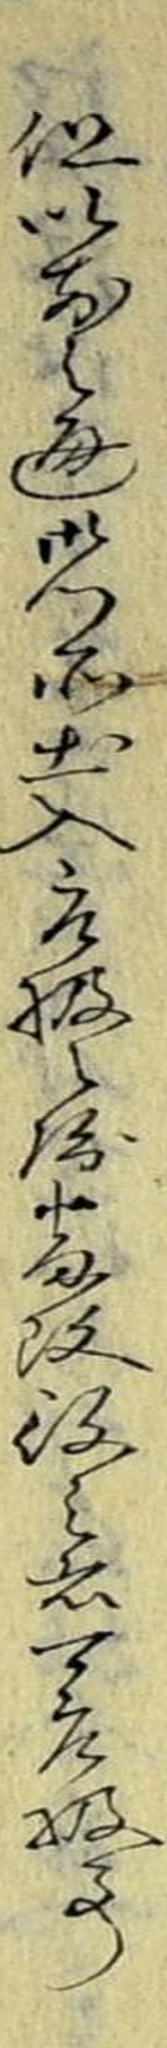但以前之通御門所出入取扱之儀番改役之者可取扱事
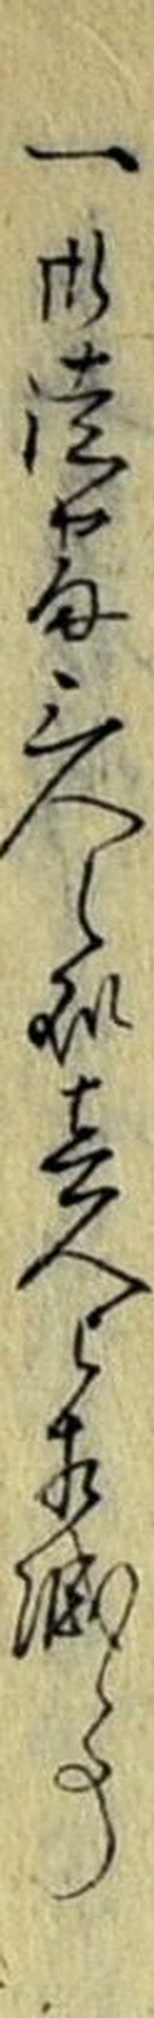一御詰番三人之処壱人被相減候事
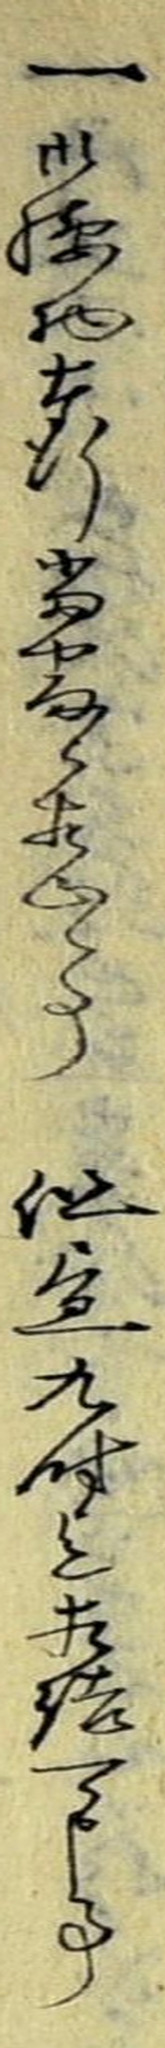一御腰物奉行当番は相止候事但昼九時迄相詰可申事

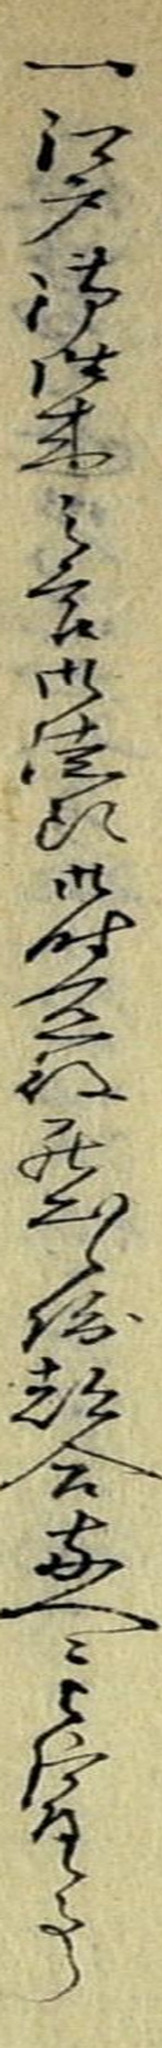一江戸御往来之節御徒頭御時宜役罷出候儀都合両人に被仰付候事
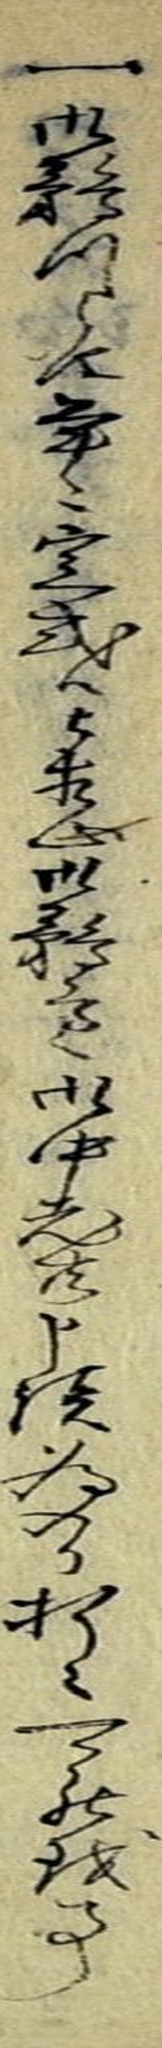一御鵜川之儀年々定式は被相止御鵜方へ御中老共申談為〆り折々可罷越事
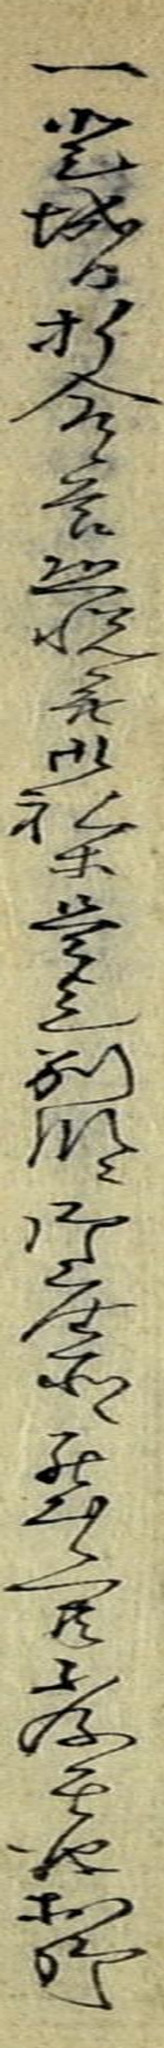一登城日折合候節恐悦并御礼是迄別段に御座所へ出候へ共不及其儀於御
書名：命令之部 四
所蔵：福井県文書館 Fukui Prefectural Archives
